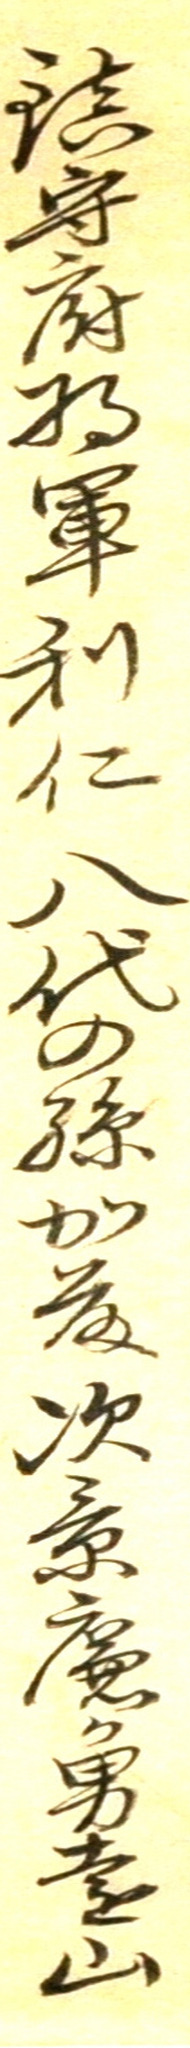鎮守府将軍利仁八代の孫加藤次景廉か男遠山
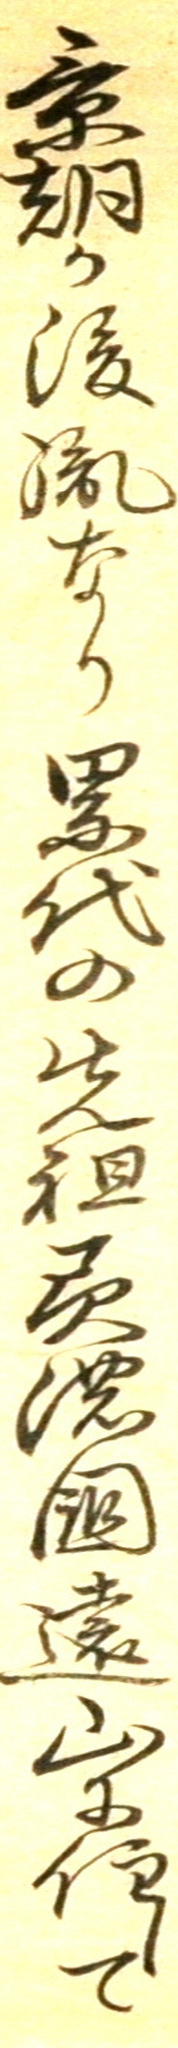景朝か後胤なり累代の先祖美濃国遠山に住して
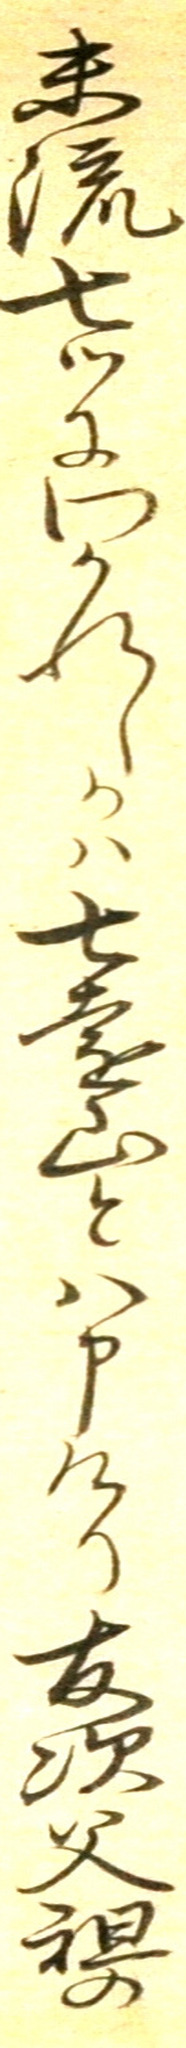末流七ツにわかれしかは七遠山とは申けり友次父祖の
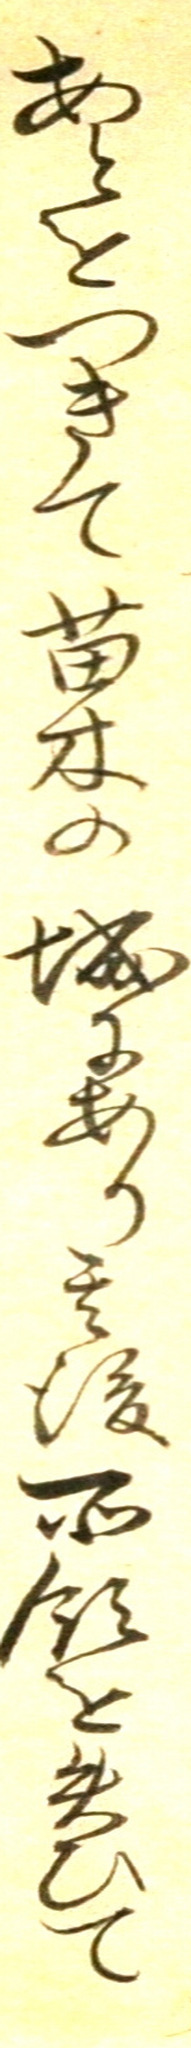あとをつきて苗木の城にあり其後所領を失ひて
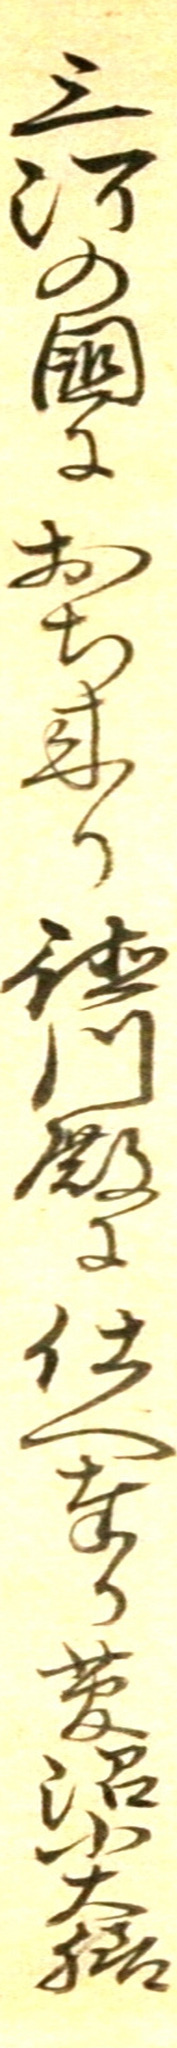三河の国におち来り徳川殿に仕へ奉り菅沼小大膳

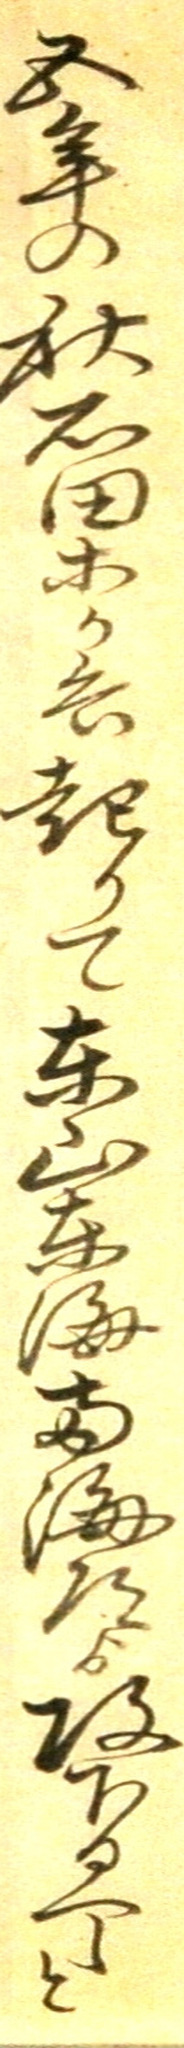五年の秋石田等か兵起りて東山東海両海道より攻下るへしと
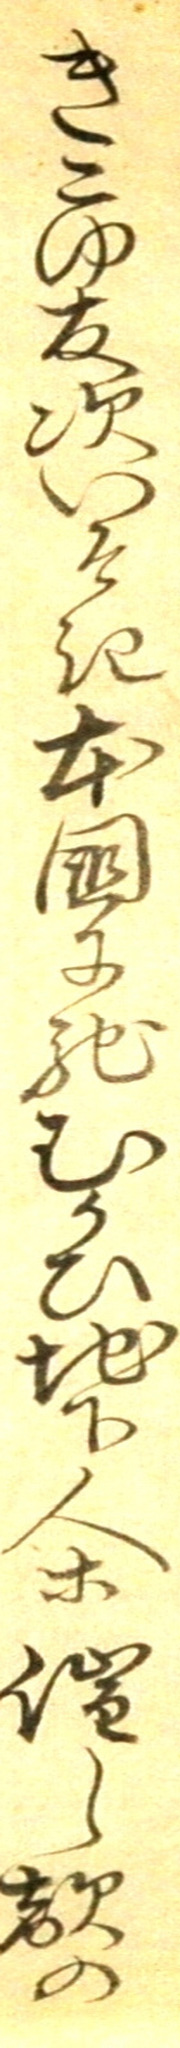きこゆ友次いそき本国に馳むかひ地下人等催し敵の
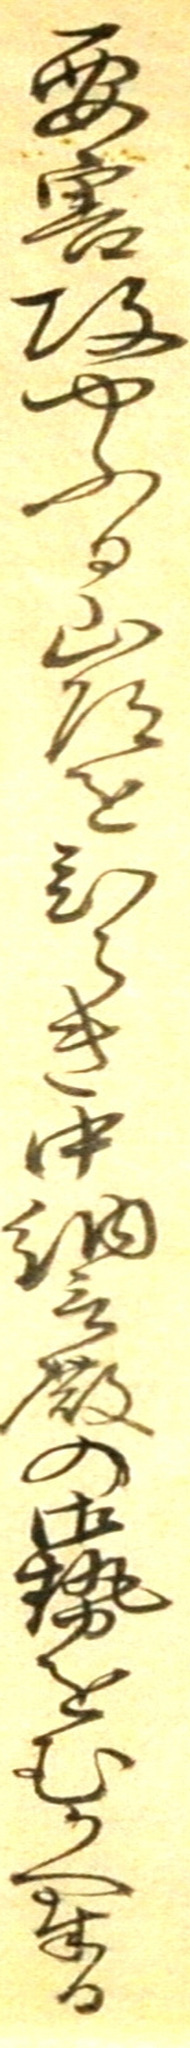要害攻やふる山道をひらき中納言の御勢をむかへ奉る
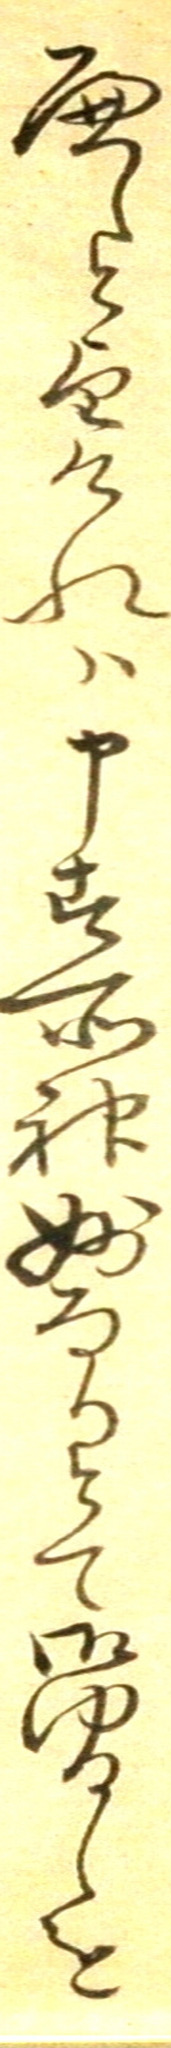へしと望けれは申す所神妙なりとて御ゆるしを
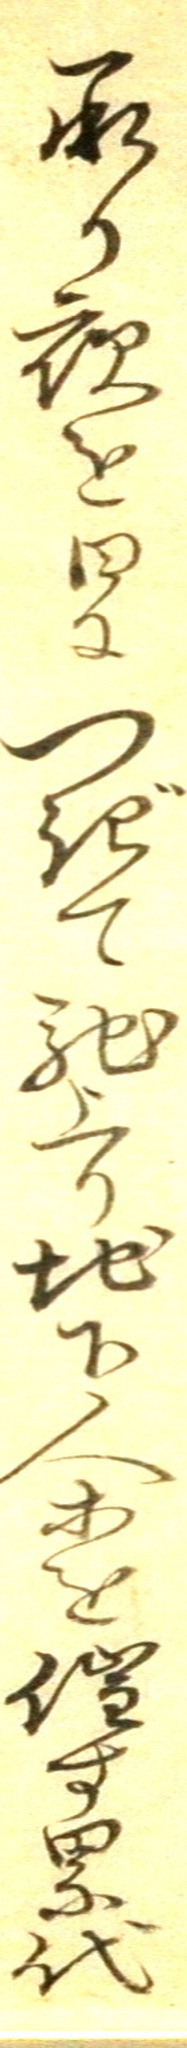承り夜を日につぎて馳上り地下人等を催す累代
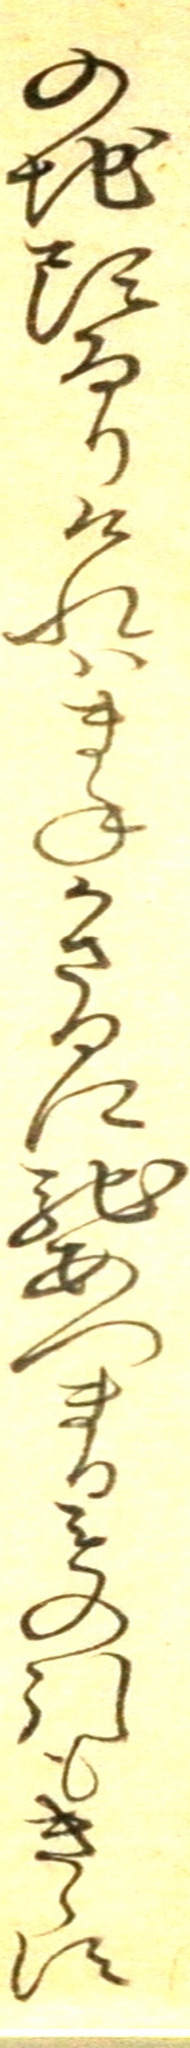の地頭なりけれはまねかさるに馳あつまるもの引もきらす
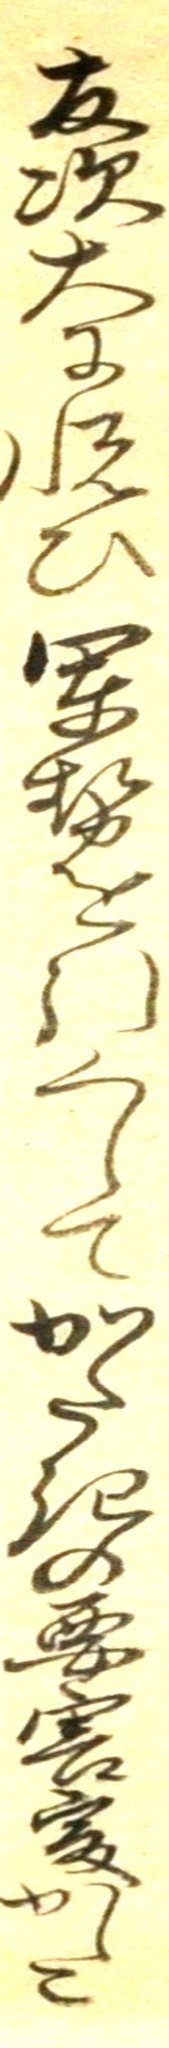友次大に悦ひ軍勢を引くしてかたきの要害爰かしこ
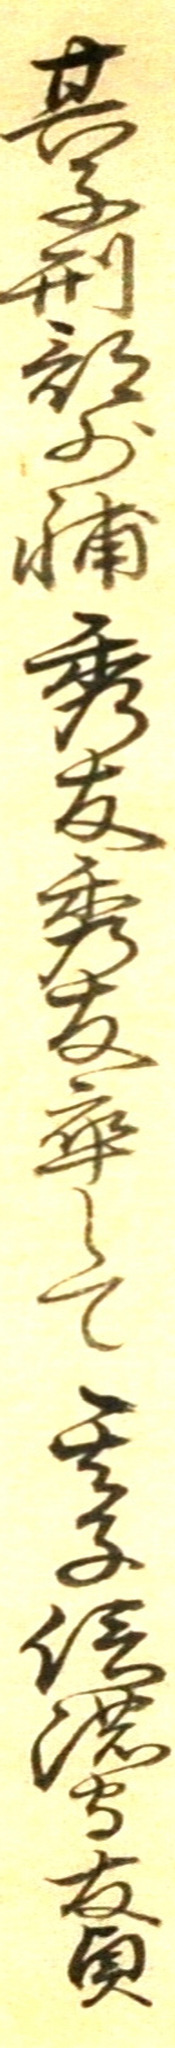其子刑部少輔秀友秀友卒して其子信濃守友貞
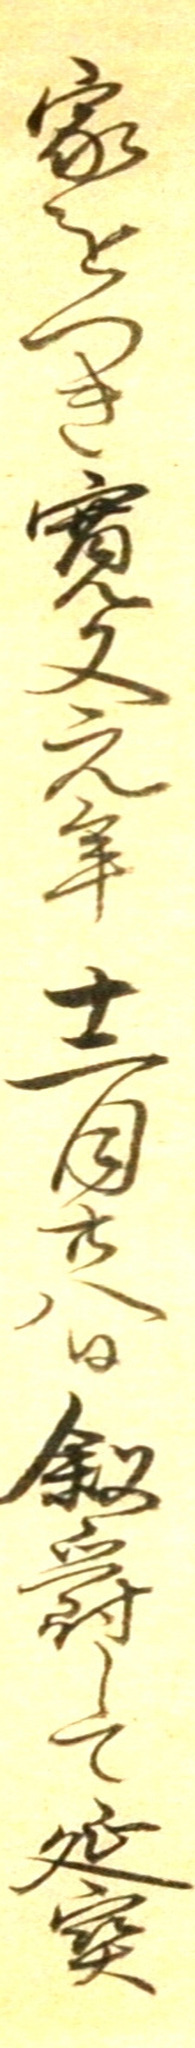家をつき寛文元年十二月廿八日叙爵して延宝
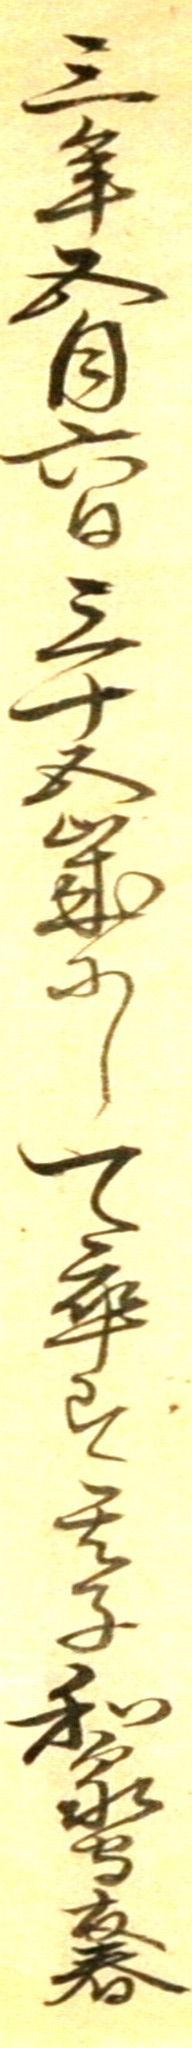三年五月六日三十五歳にして卒す其子和泉守友春
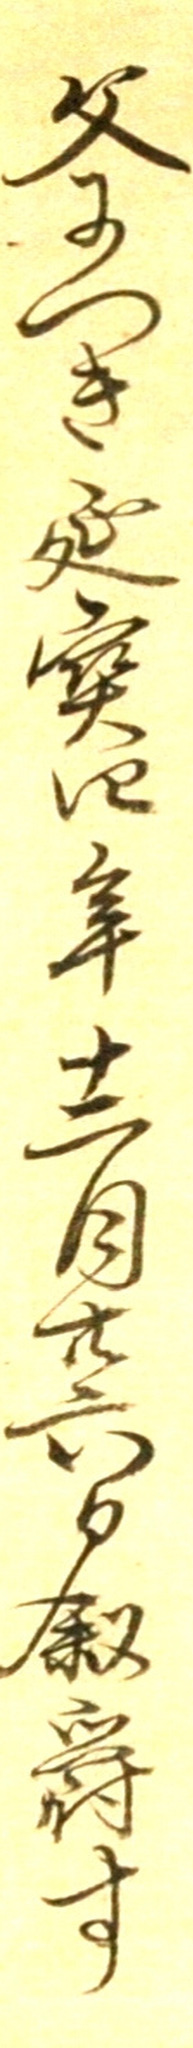父につき延宝四年十二月廿六日叙爵す
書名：藩翰譜（九・上）
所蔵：伊那市立高遠町図書館・合同会社AMANE
